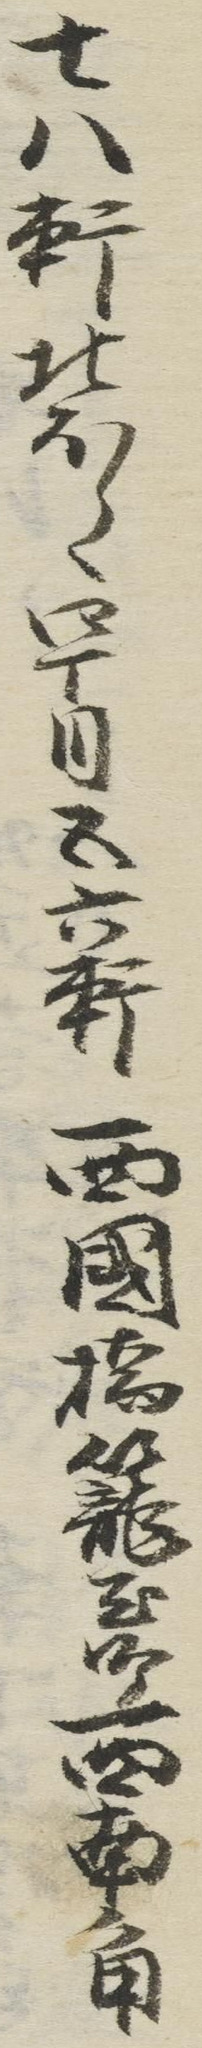七八軒北ほく四丁目五六軒西国橋籠屋町西南角
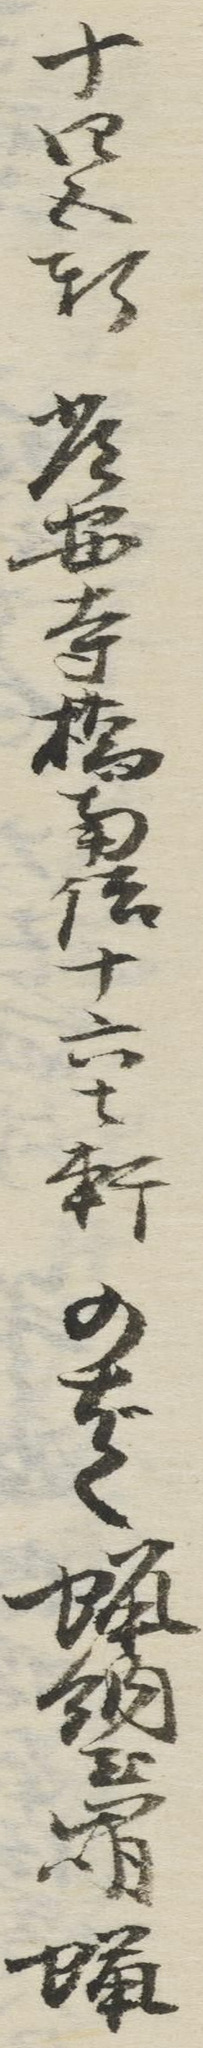十四五軒常安寺橋南詰十六七軒のぞく蝋納屋崩蝋
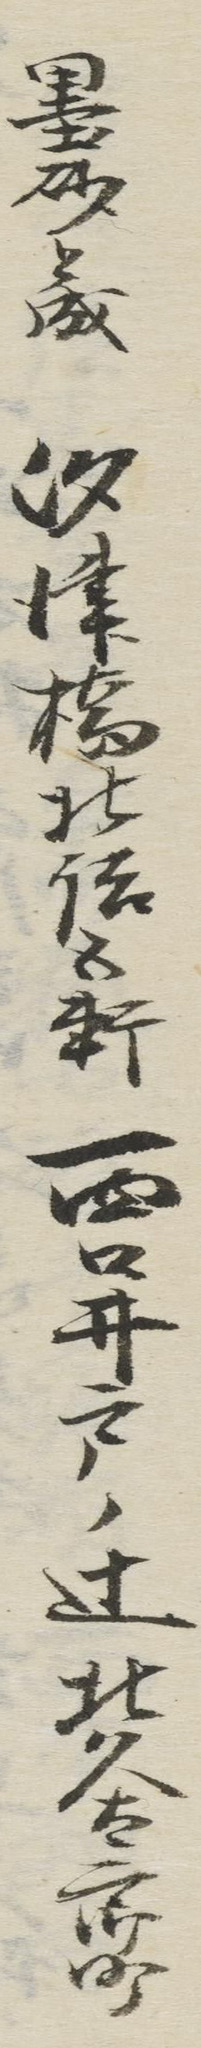墨砂と成汐津橋北詰五軒西口井戸ノ辻北久太郎町
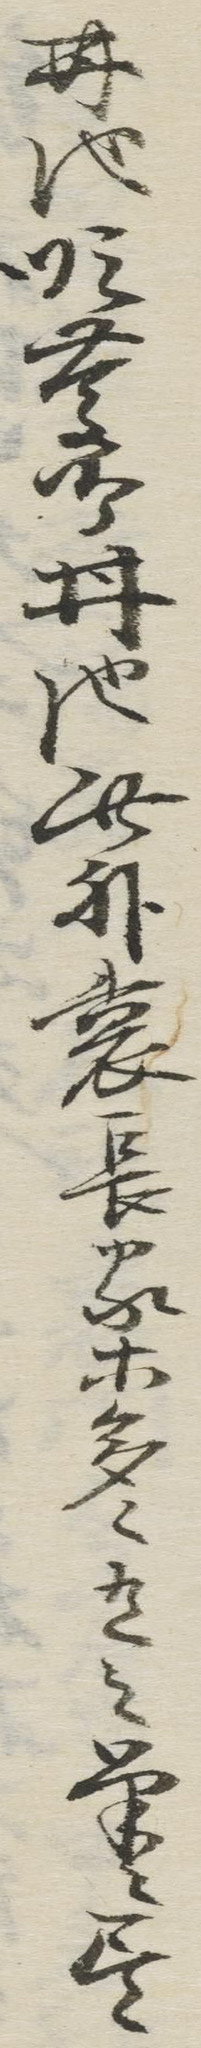丼池順慶町丼池此外裏長家等多く有之筆ニ尽
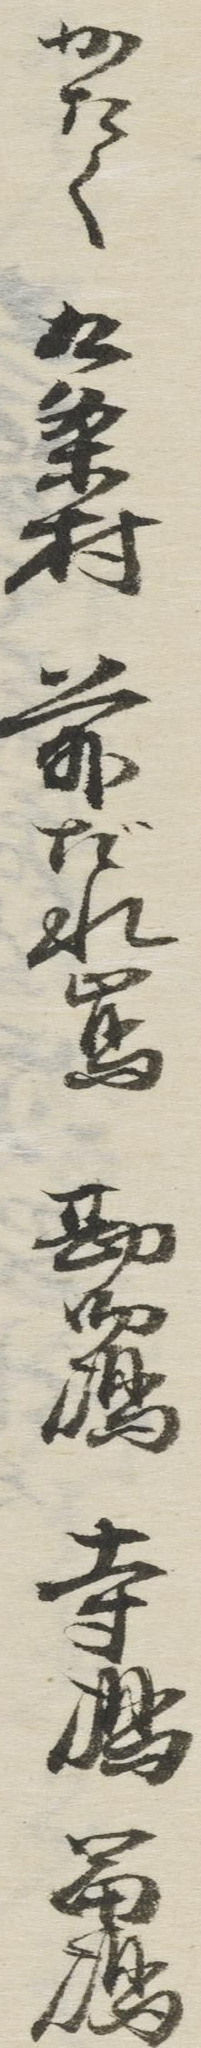かた〳〵九条村前だれ嶌勘助島寺嶋冨嶋
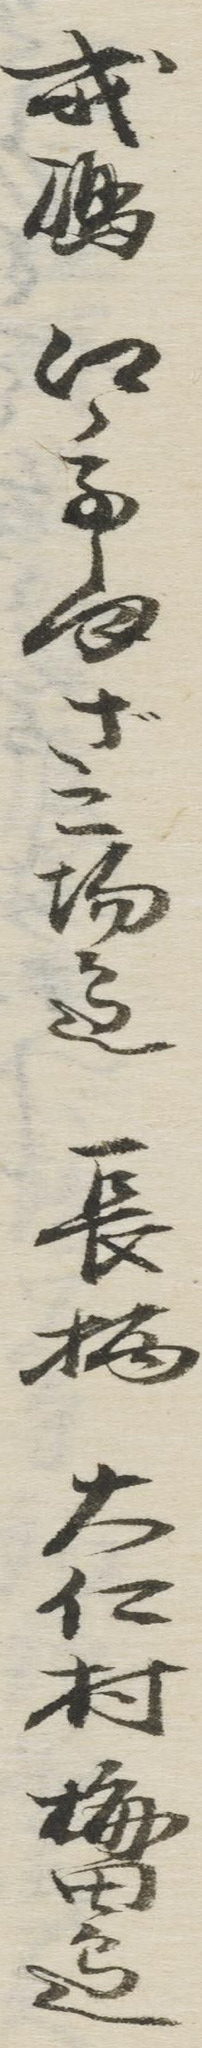戎島江ノ子しまざこ場迄長柄大仁村梅田迄
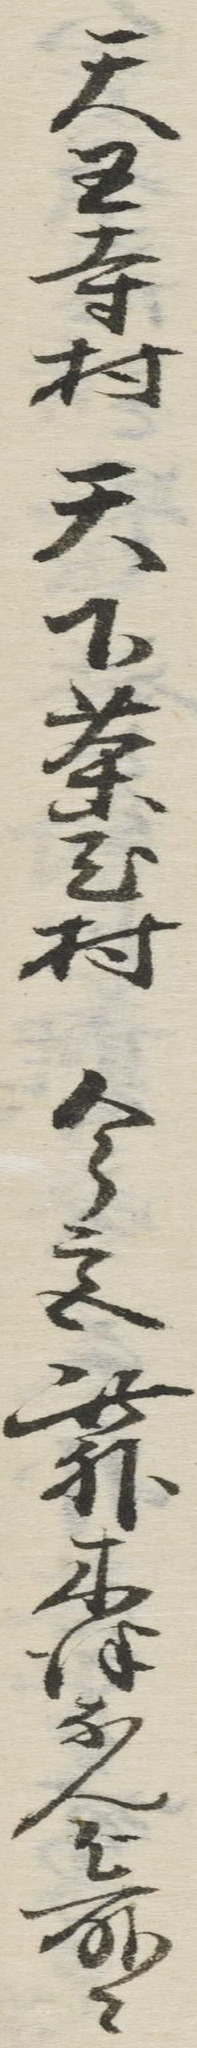天王寺村天下茶屋村今宮此外木津なんば所々
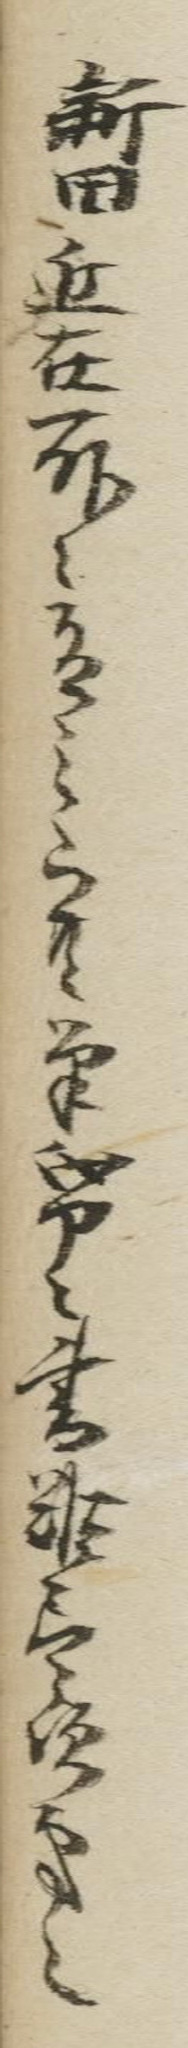新田近在所々有之候へ共筆紙二書難尽次第也
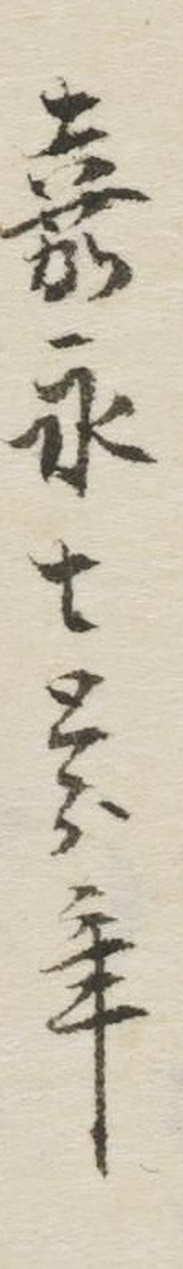嘉永七とら年
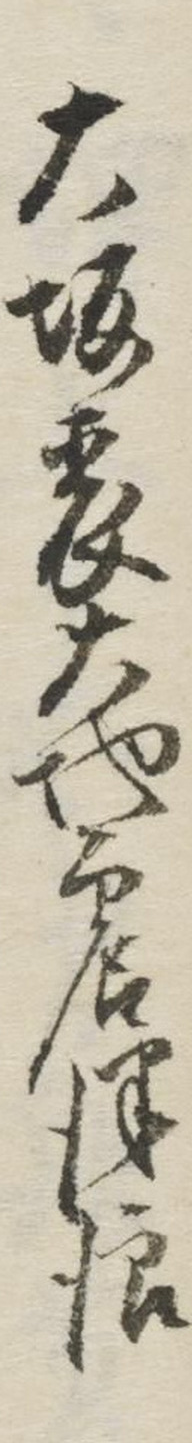大坂表大地震津浪
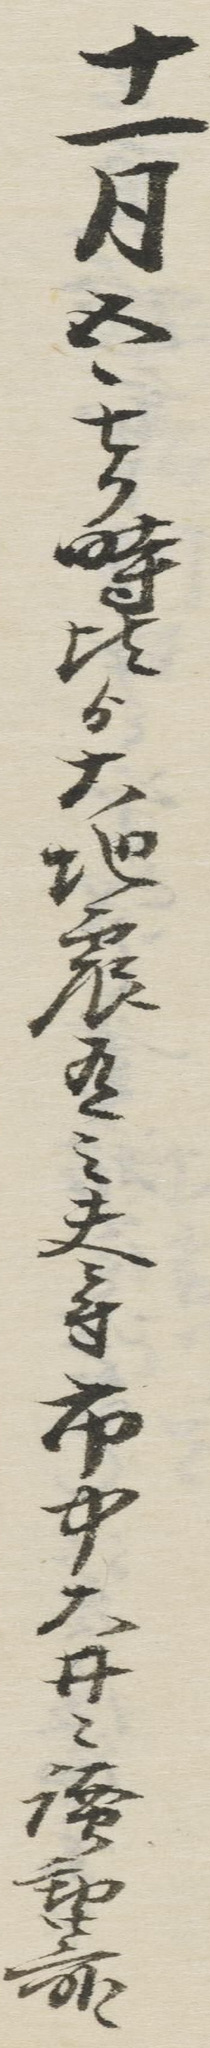十一月五日七ツ時頃ゟ大地震有之夫ニ付市中大井ニ騒動仕候所
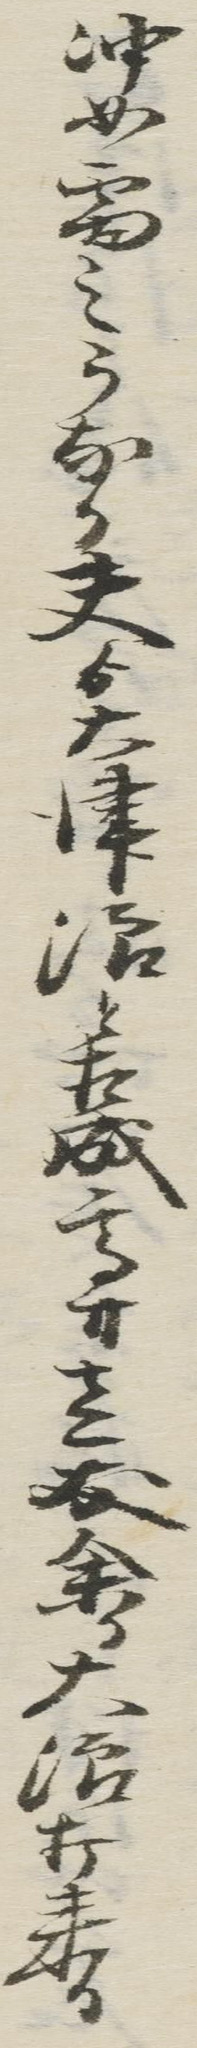沖如雷之うなり夫ゟ大津浪と相成高サ壱丈余り大浪打来る
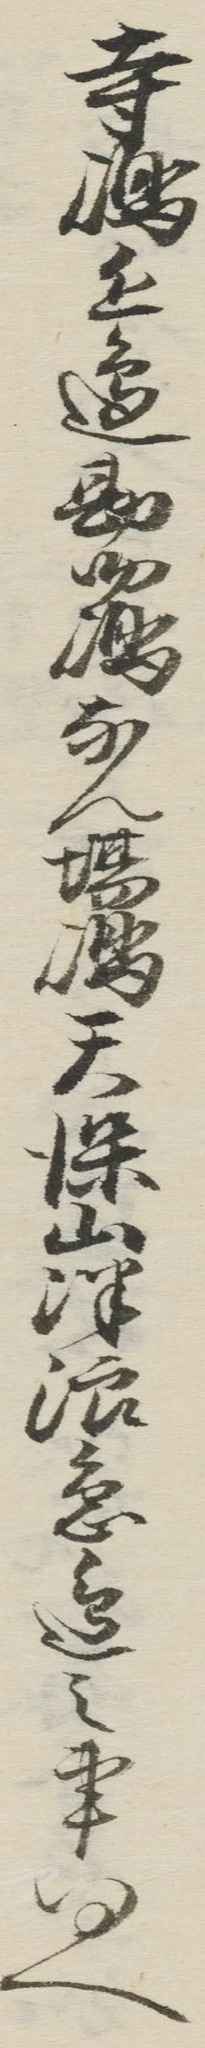寺嶋近辺勘助嶋なん場嶋天保山津浪急辺之事いへ
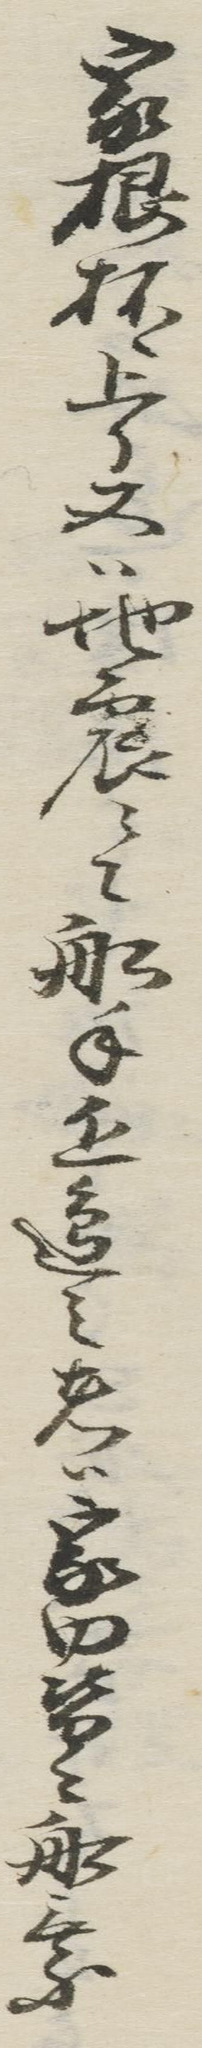家根抔へ上り又ハ地震ニテ船手近辺之者ハ家内皆々船乗
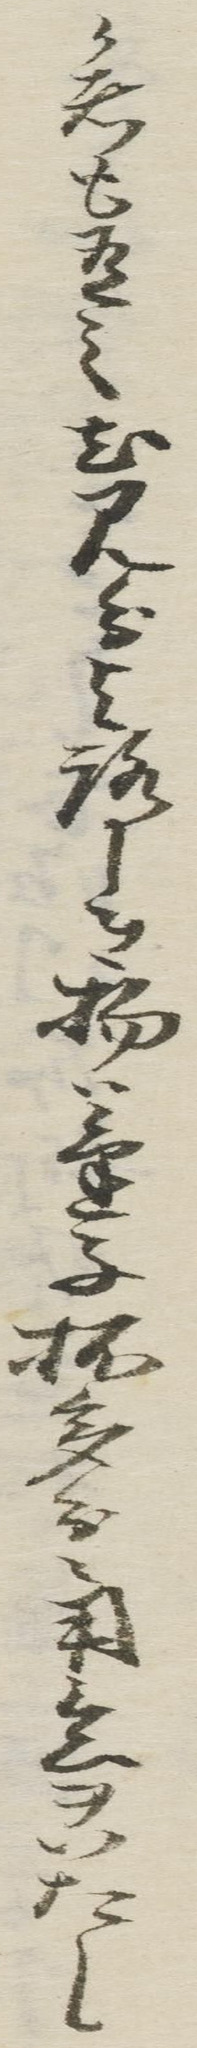候者も有之尤見分よろしき物ハ金子抔多分ニ用意ヲいたし
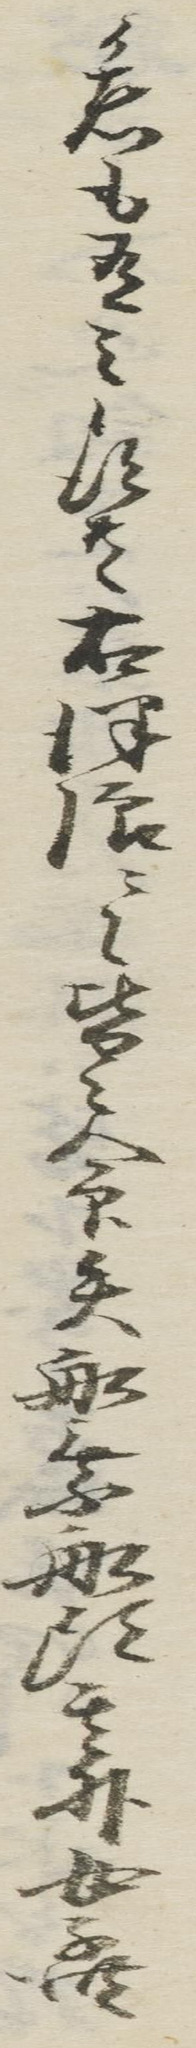候者も有之候得共右津浪ニて皆々命失船乗船頭其外女子供
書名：諸国大地震大津波一代記
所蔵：東京大学地震研究所図書室 Earthquake Research Institute Library, The University of Tokyo, JAPAN
